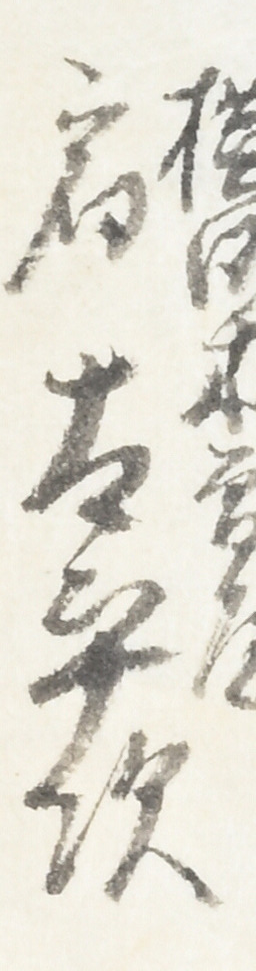宿太平次
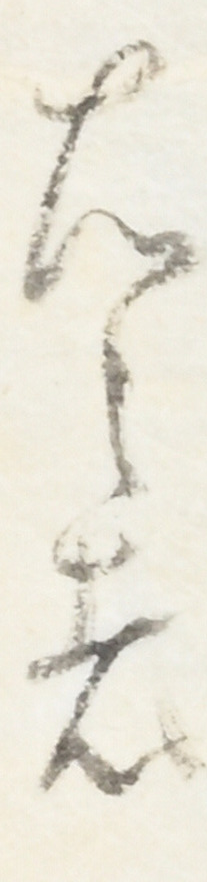右之者

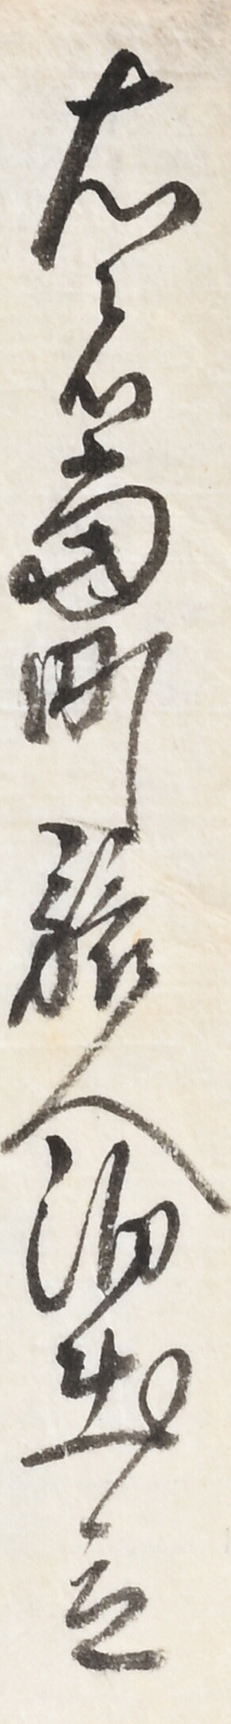右者当町旅人泊出立
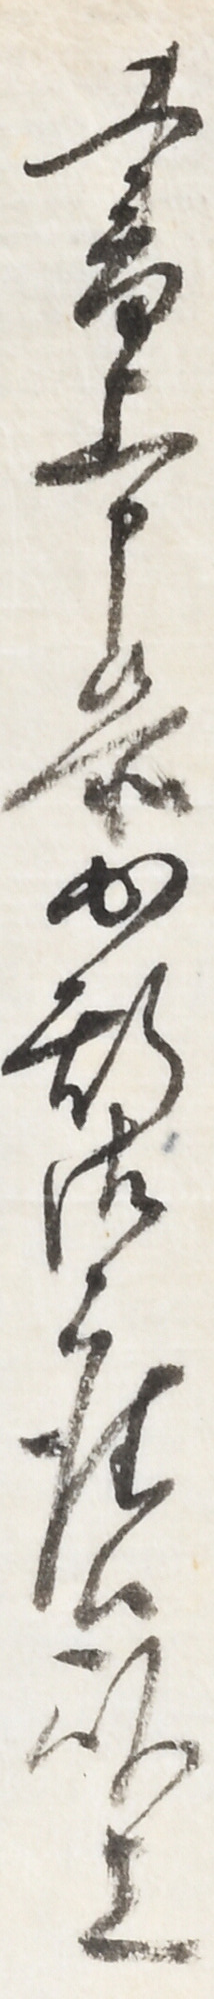書上申候所如斯御座候以上
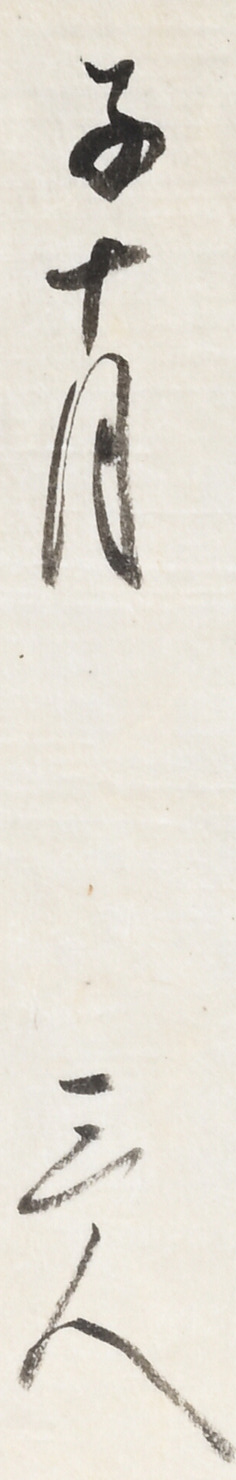子十月三人
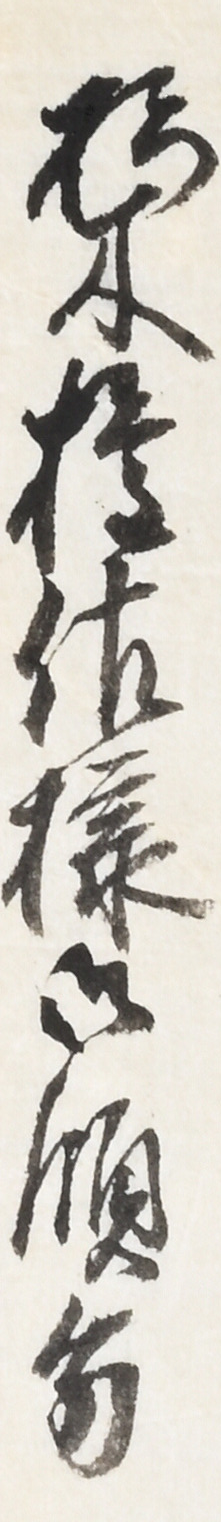朽木権佐様御領分
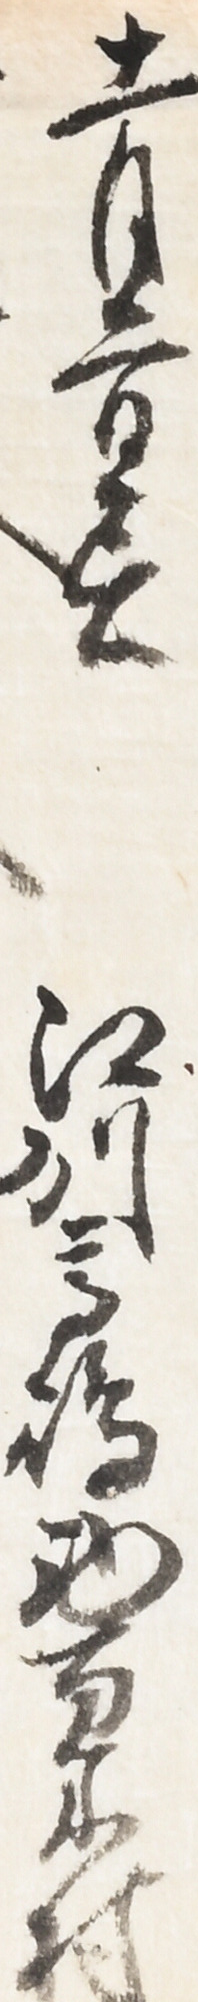十一月二日着江州高嶋西万木村
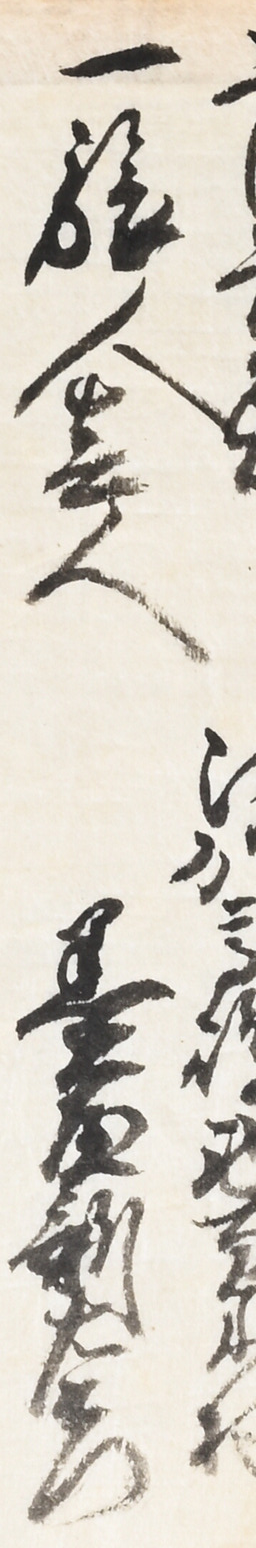一旅人壱人墨屋新右衛門
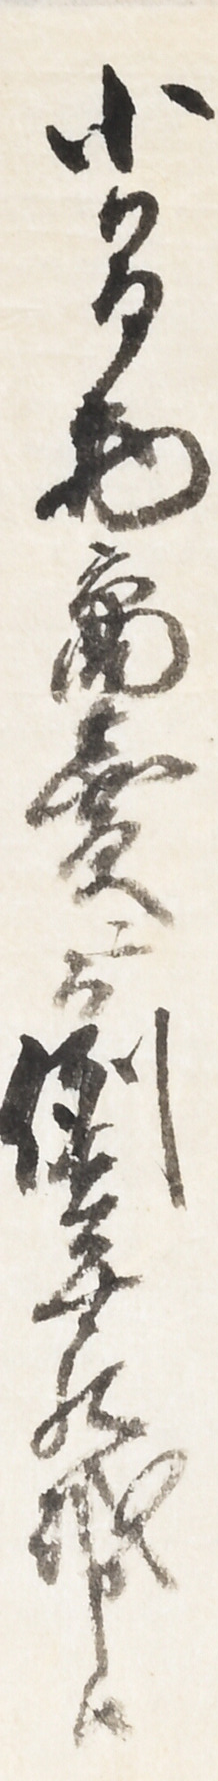小間物商売ニ而例年罷越申候
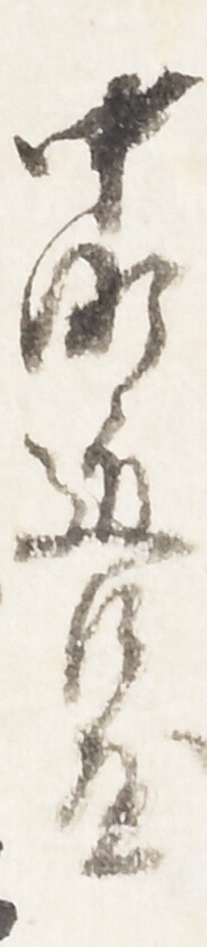中町近江屋
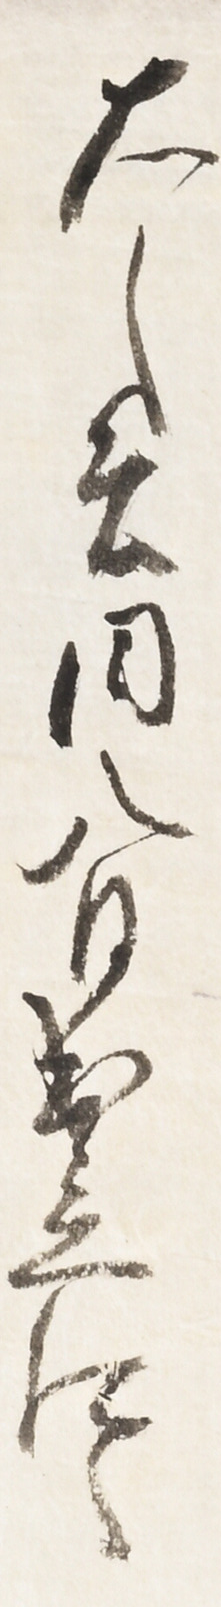右之者同八日出立仕候
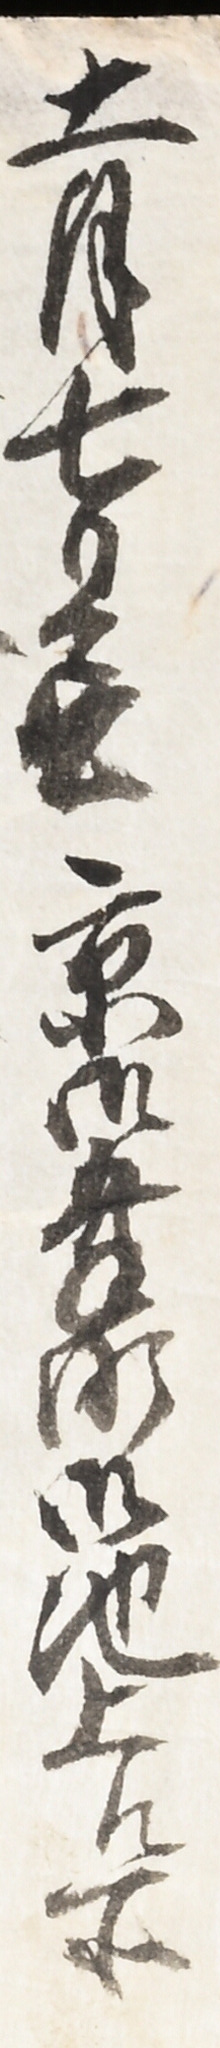十一月七日着京御幸町御池通上ル所
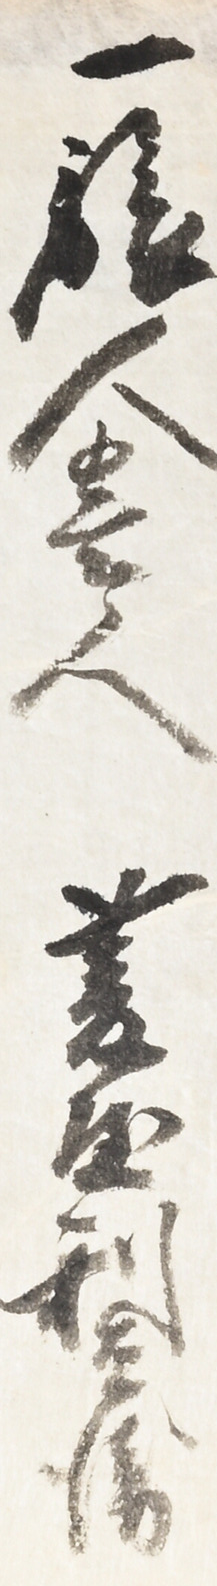一旅人壱人菱屋利兵衛
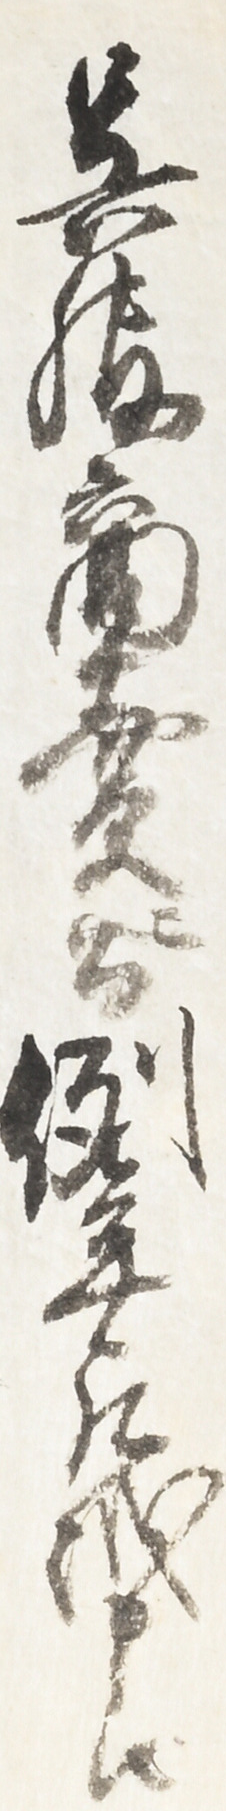呉服商売ニ而例年罷越申候
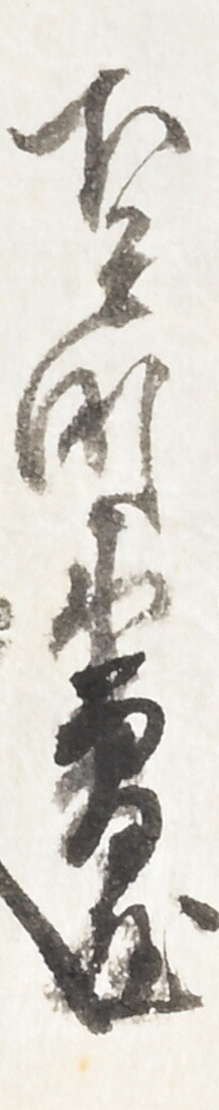下モ町木曽屋
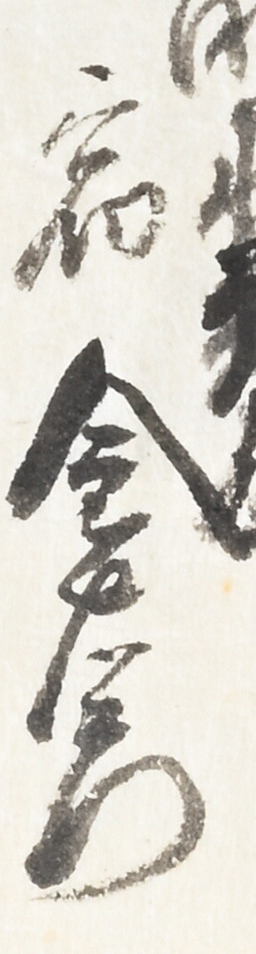宿金右衛門
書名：旅人泊控帳
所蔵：伊那市立高遠町図書館・合同会社AMANE
